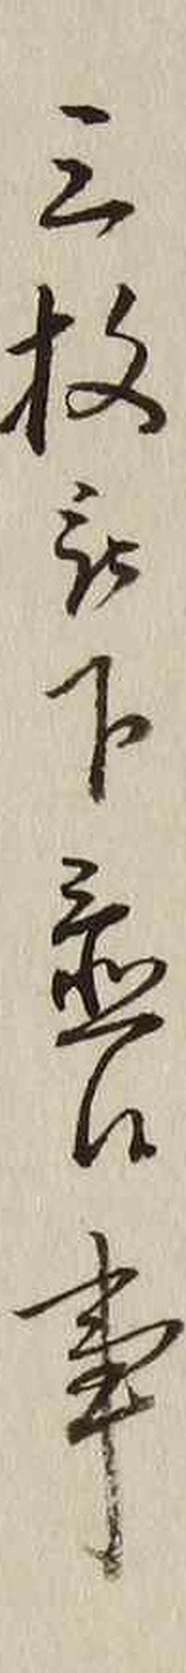三枚被下置候事
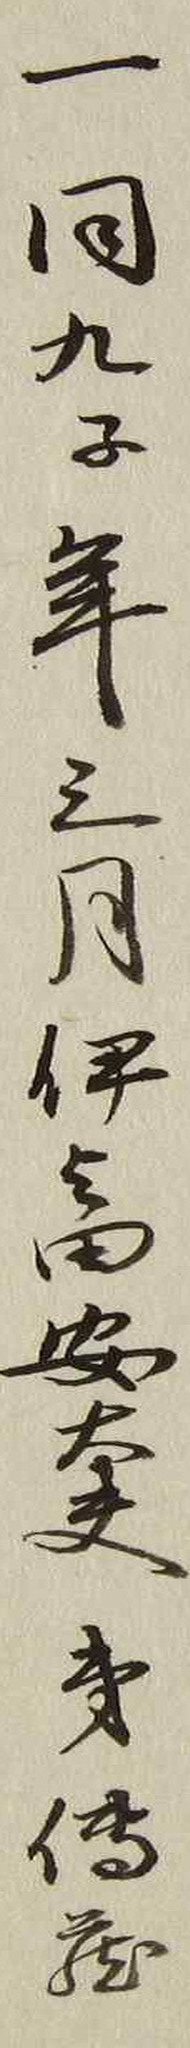一同九子年三月伊与田安太夫弟傳蔵
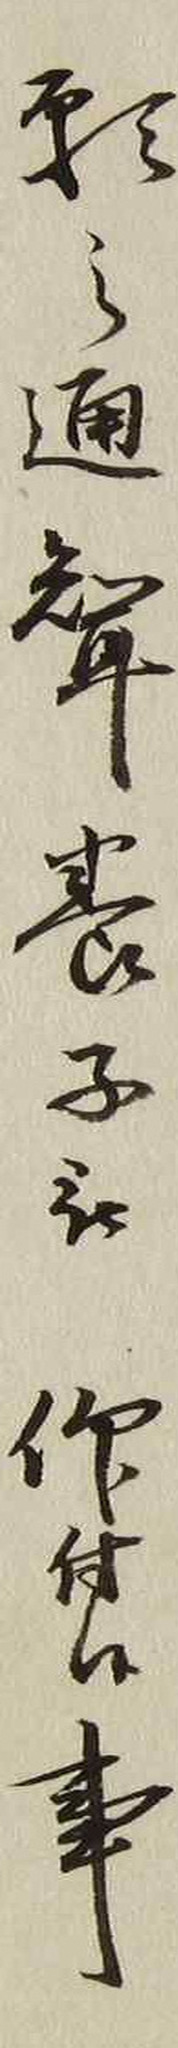願之通聟養子被仰付候事
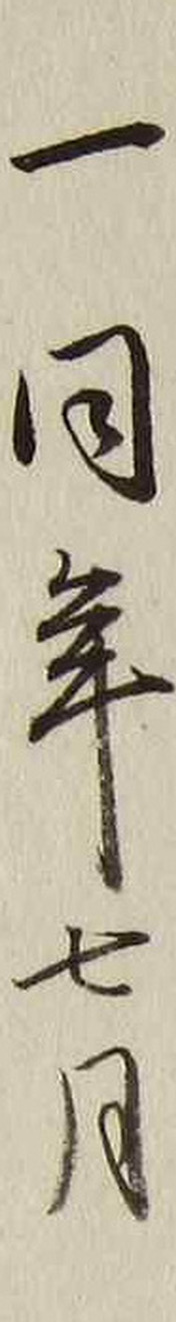一同年七月
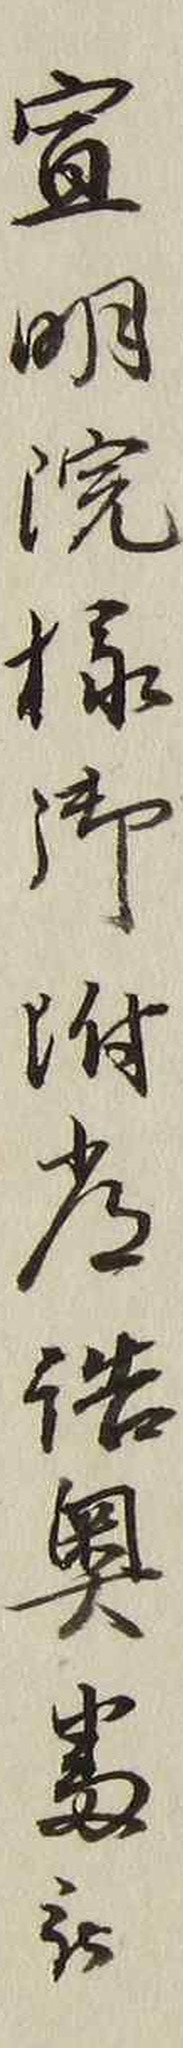宣明院様御附常詰奥番被
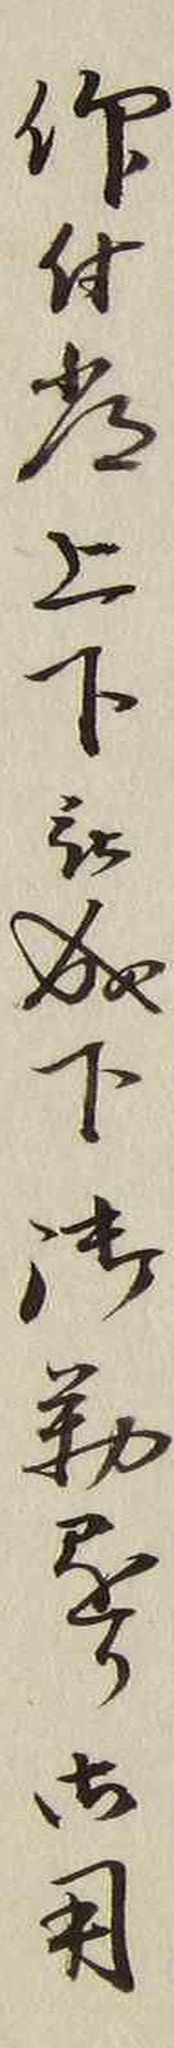仰付常上下被成下御勤懸り御用
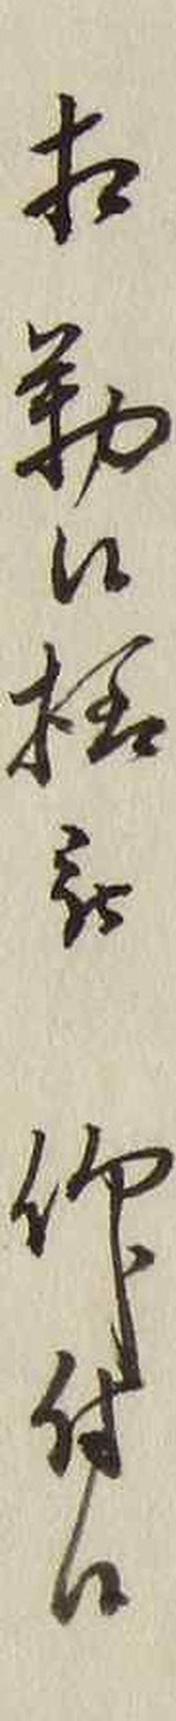相勤候様被仰付候

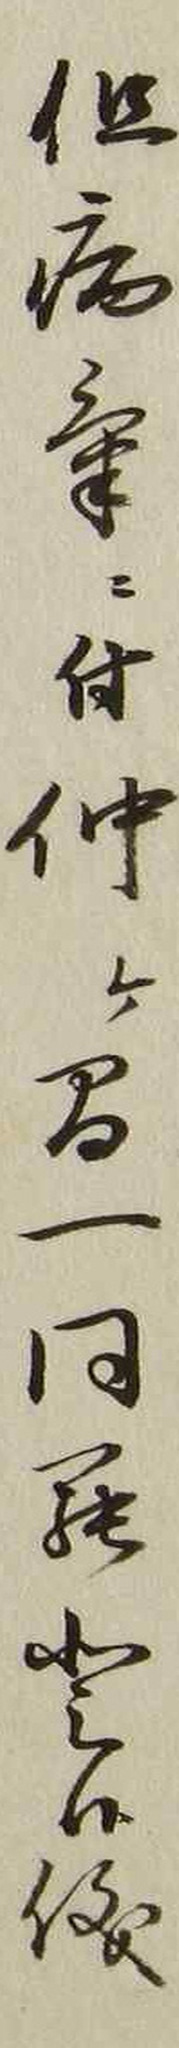但病気ニ付仲ケ間一同罷登候儀
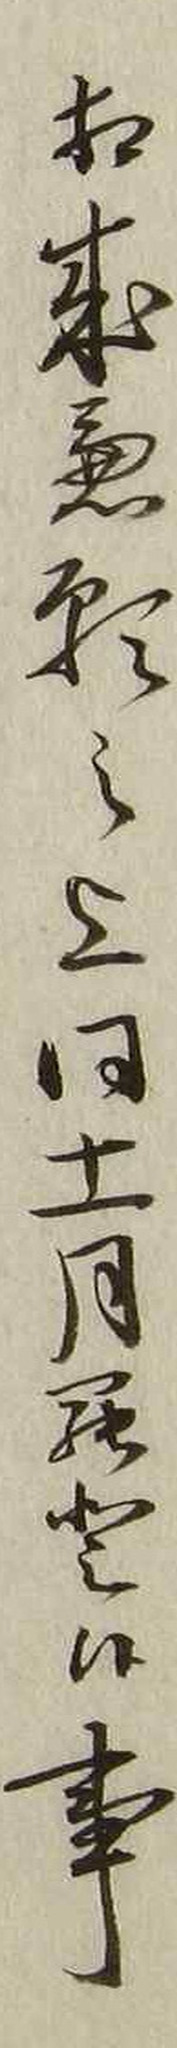相成兼願之上同十一月罷登候事
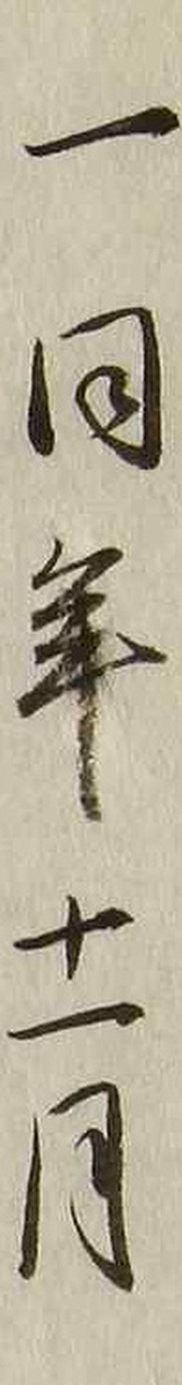一同年十一月
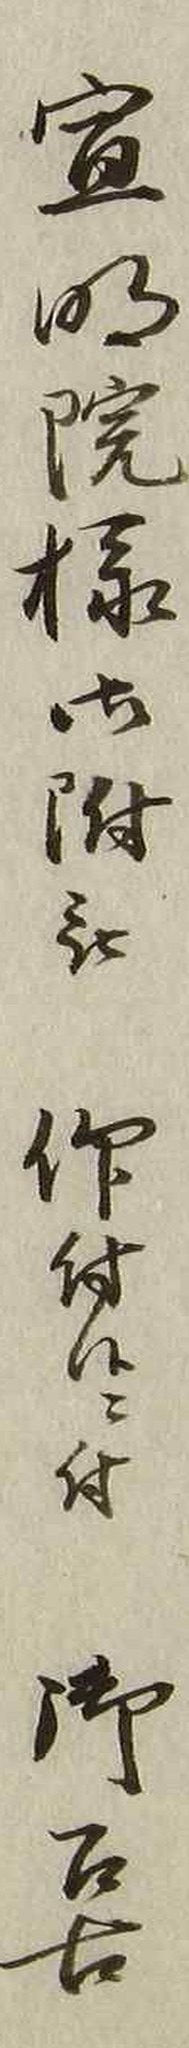宣明院様御附被仰付候ニ付御召古
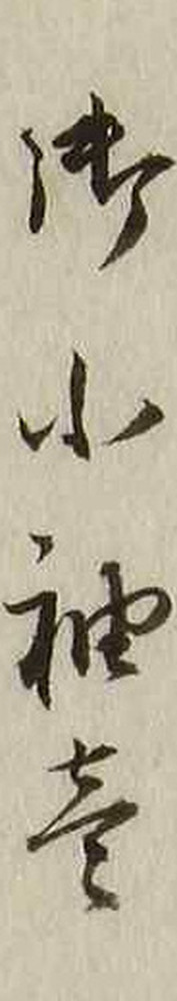御小袖壱
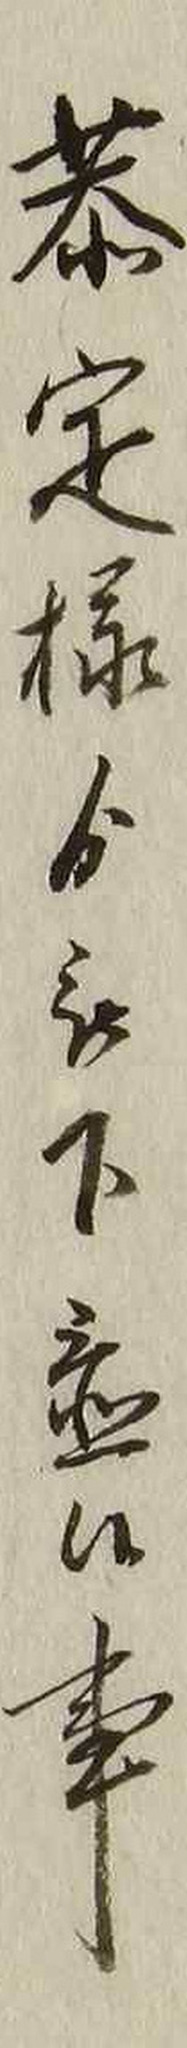恭定様ゟ被下置候事
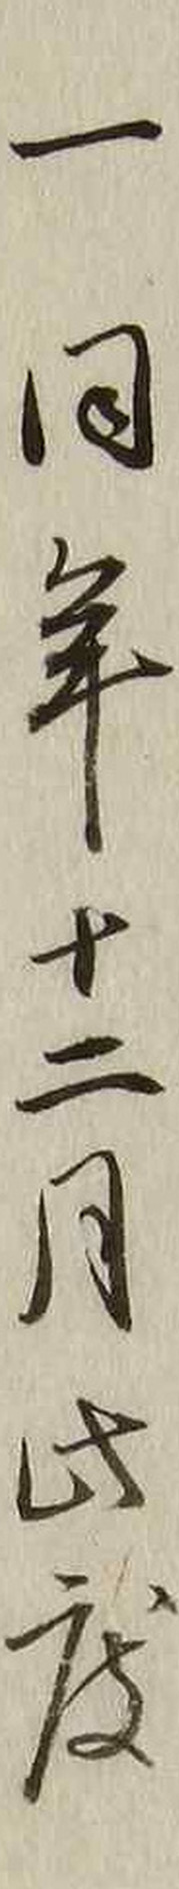一同年十二月此度
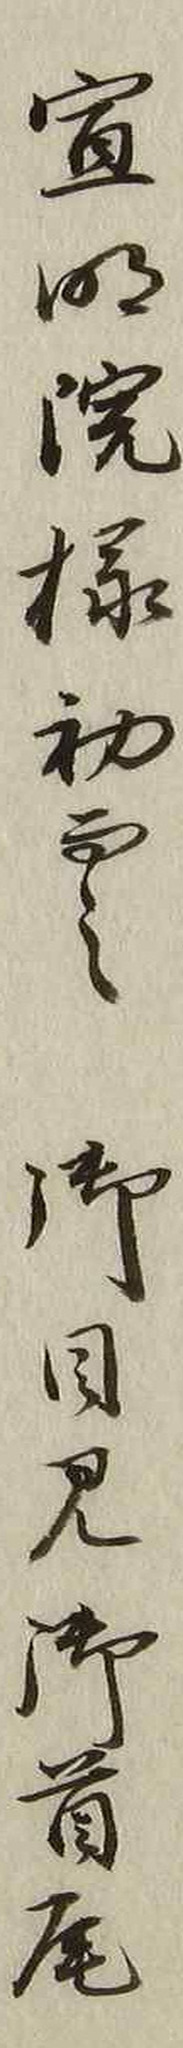宣明院様初而之御目見御首尾
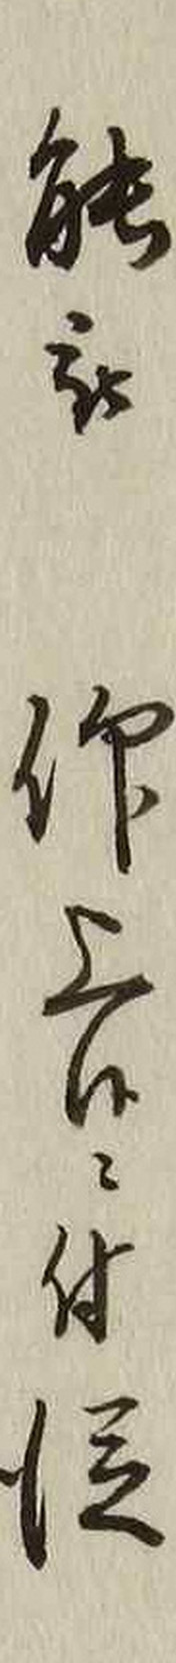能被仰上候ニ付従
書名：諸士系譜　巻之160　な之部2
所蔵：会津若松市立会津図書館
